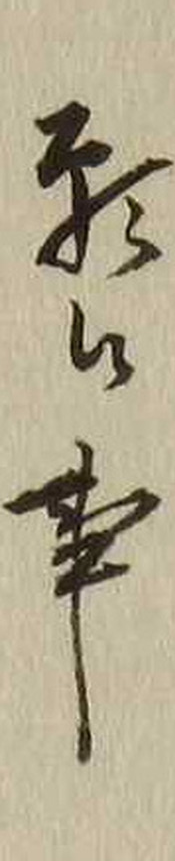願候事
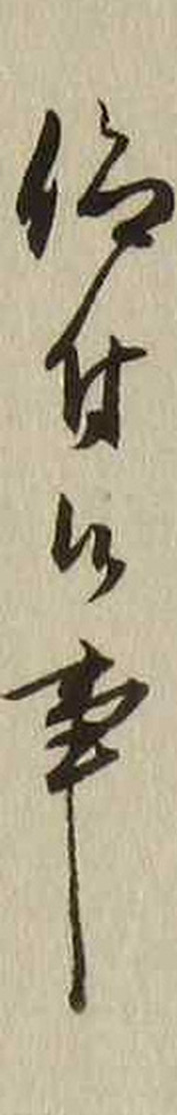仰付候事
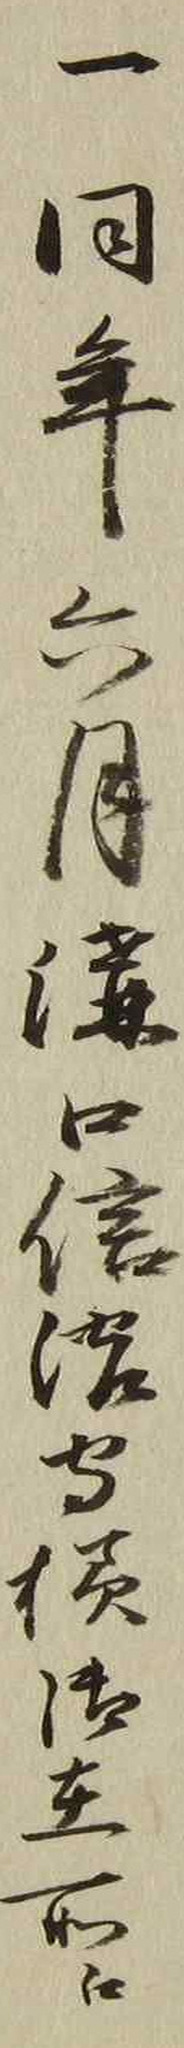一同年六月溝口信濃守様御在所江
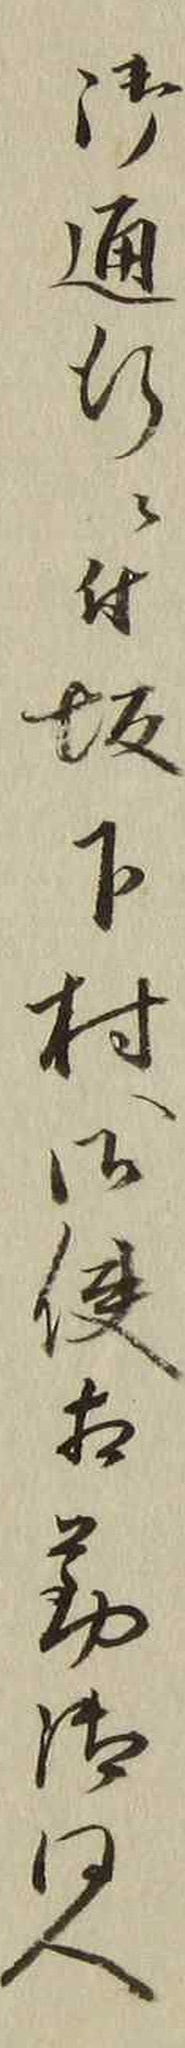御通行ニ付坂下村へ御使相勤御同人
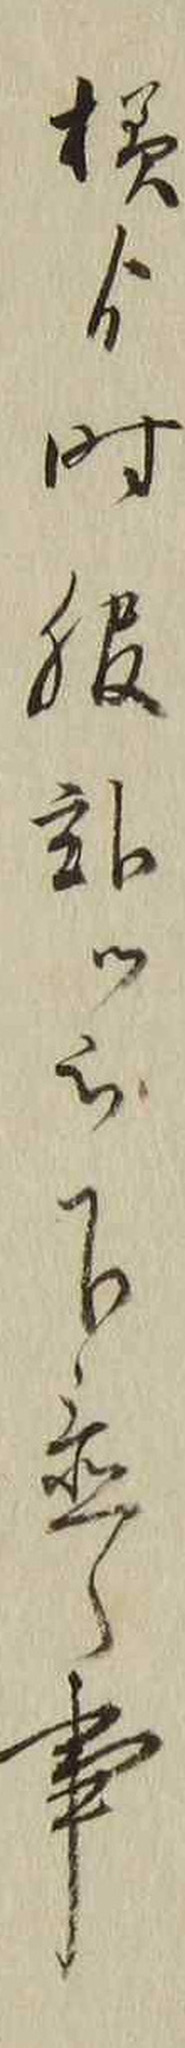様ゟ時服弐ツ被下置候事
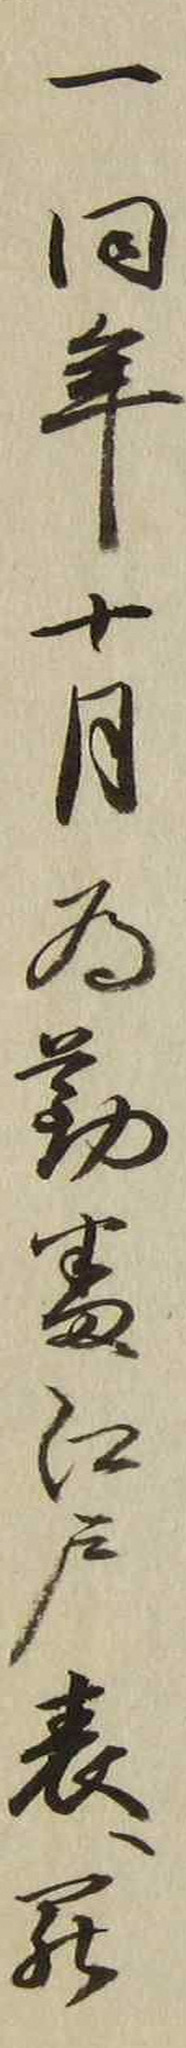一同年十月為勤番江戸表へ罷
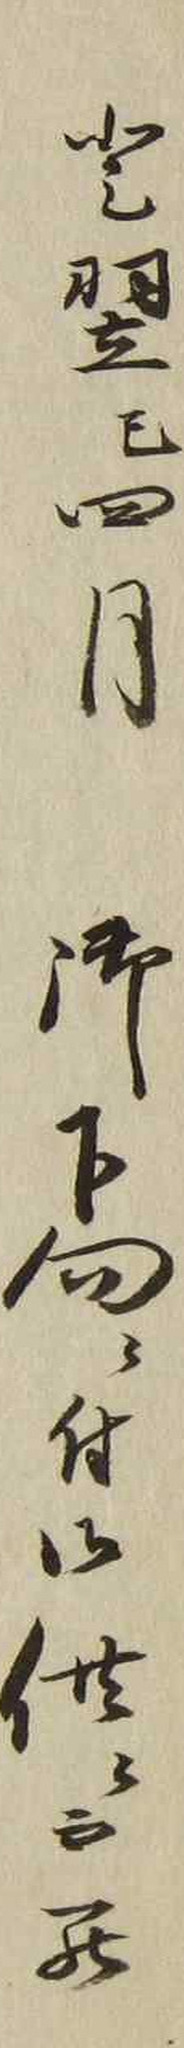登翌巳四月御下向ニ付御供ニ而罷

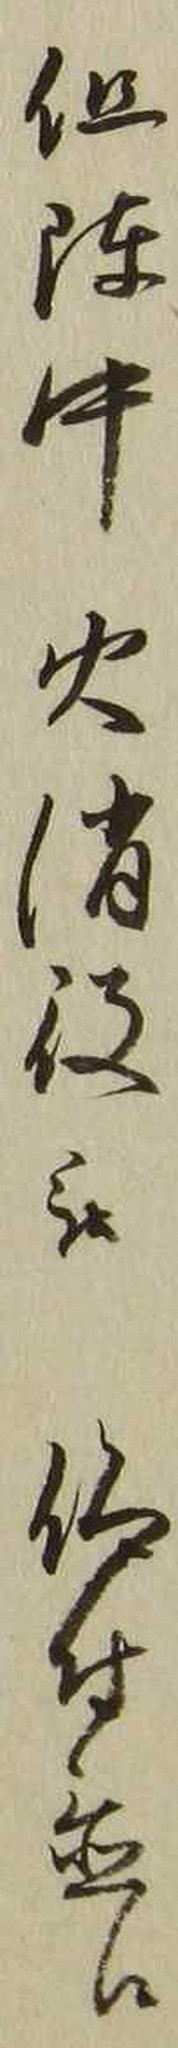但陣中火消役被仰付置候
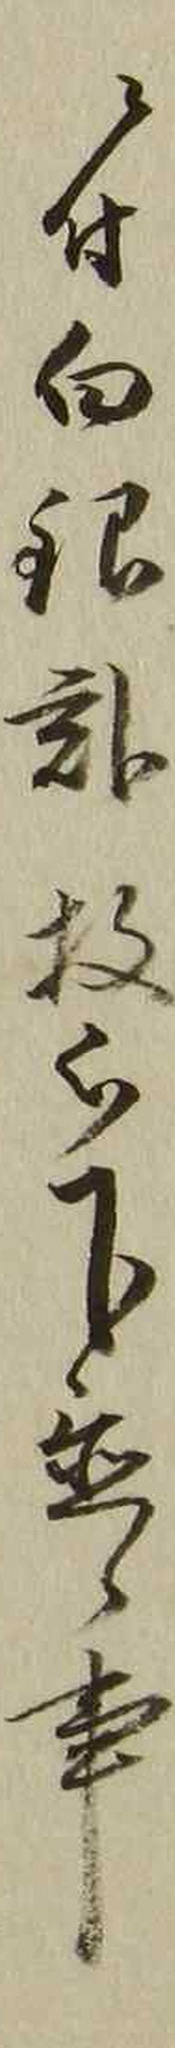ニ付白銀弐枚被下置候事
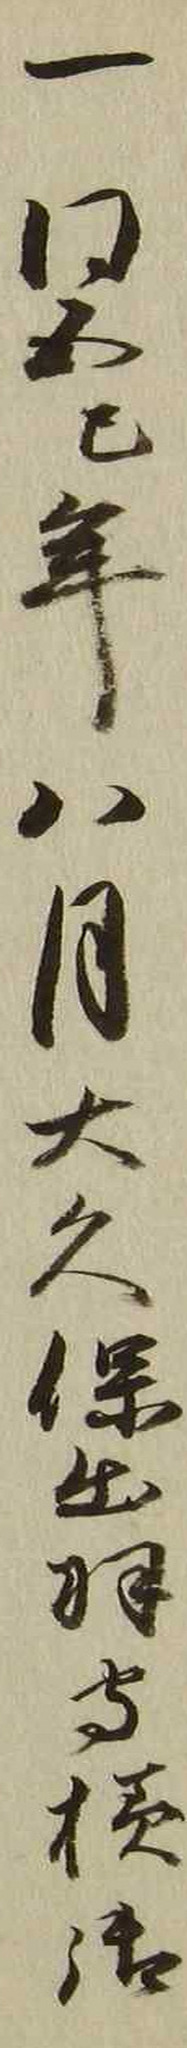一同五巳年八月大久保出羽守様御
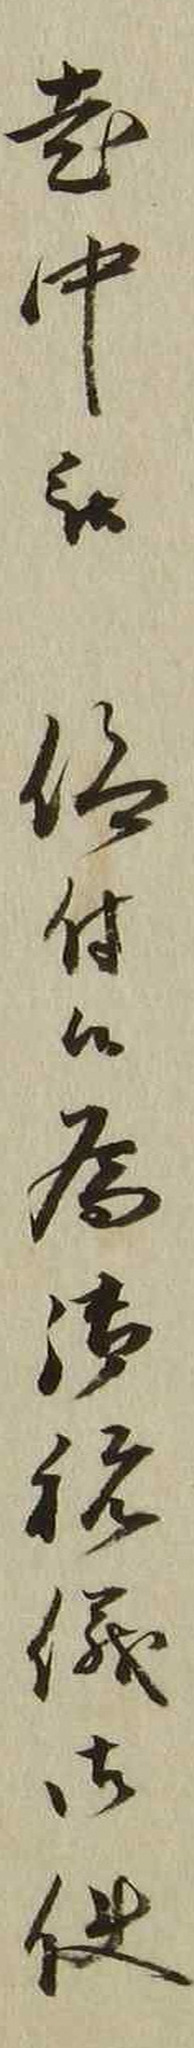老中被仰付候為御祝儀御使
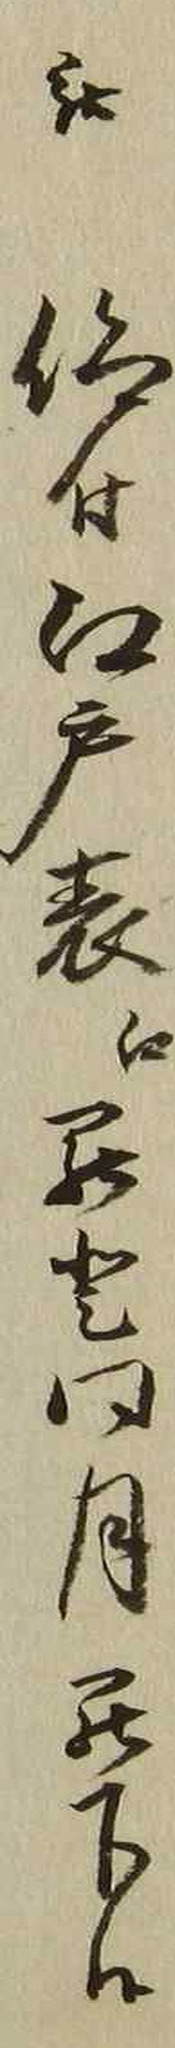被仰付江戸表江罷登同月罷下候
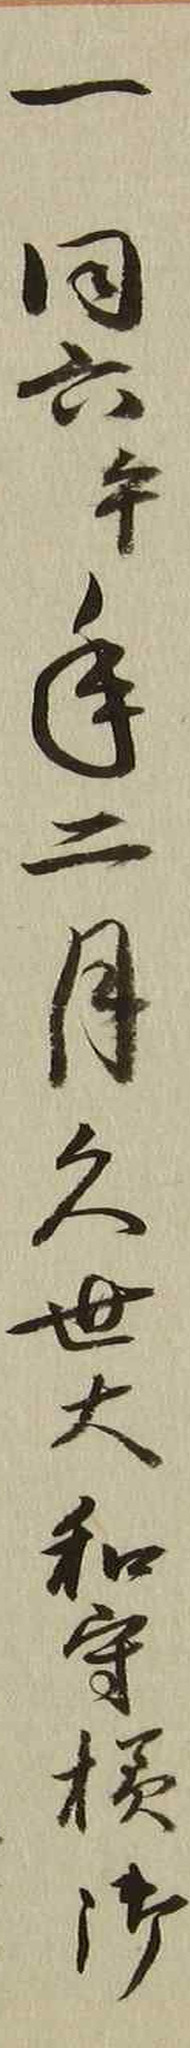一同六午年二月久世大和守様御
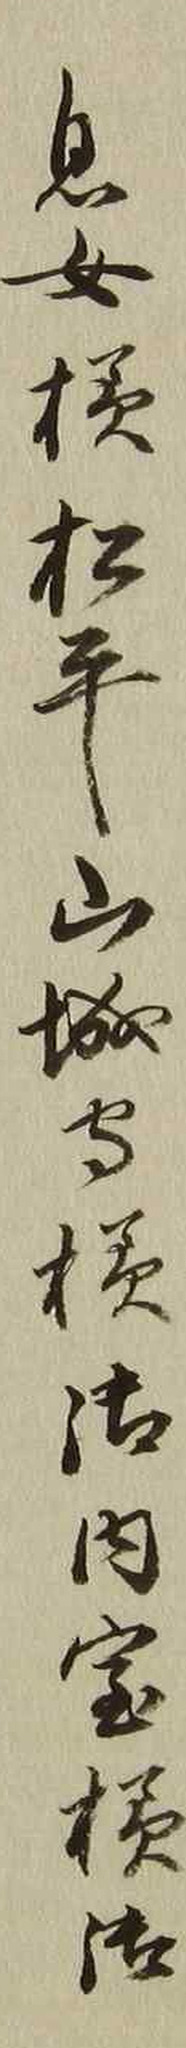息女様松平山城守様御内室様御
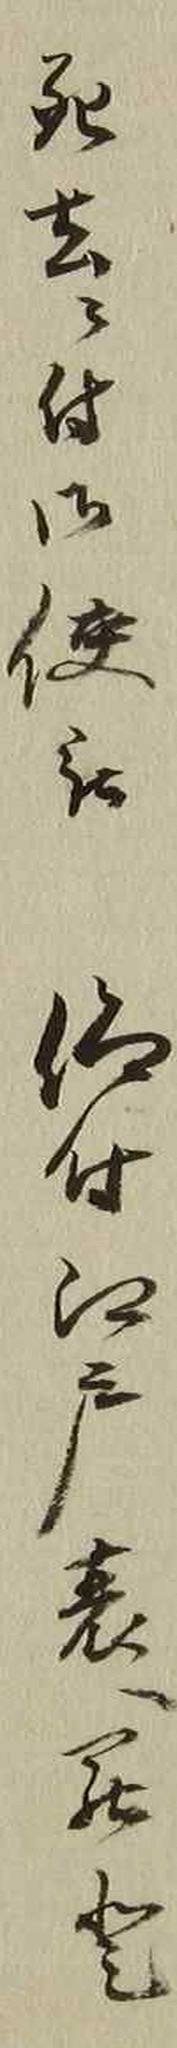死去ニ付御使被仰付江戸表へ罷登
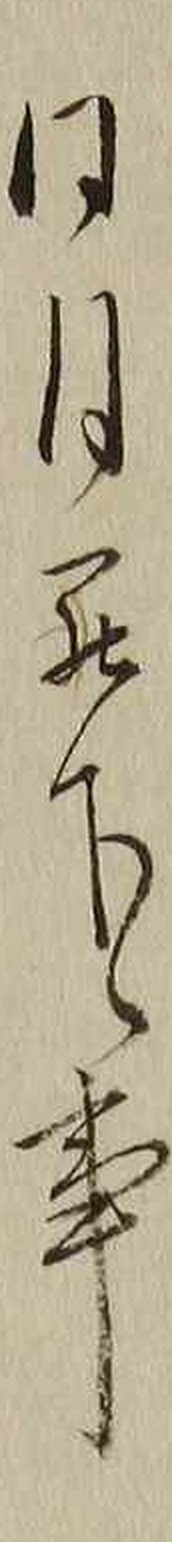同月罷下候事
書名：諸士系譜　巻之69　を之部3
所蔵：会津若松市立会津図書館
